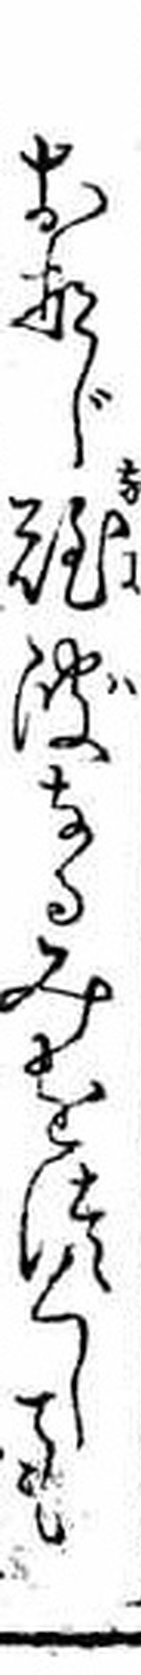おなじ難波なるみをつくしても
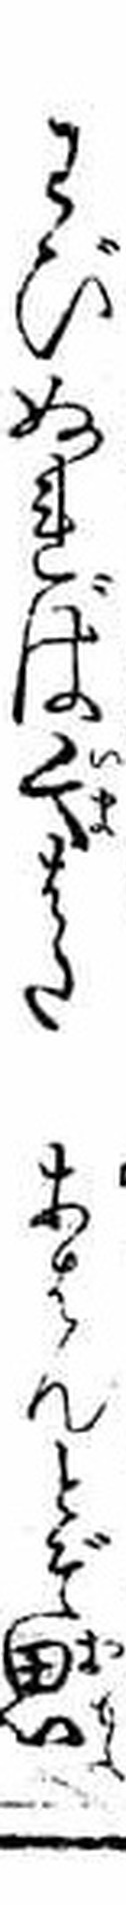わびぬれば今はたあはんとぞ思
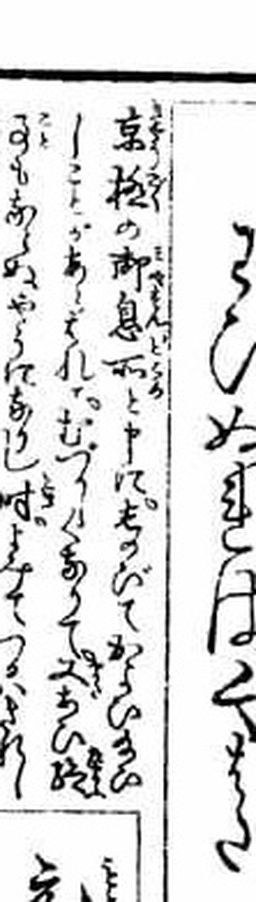京極の御息所と申にしのびてかよひ給ひ
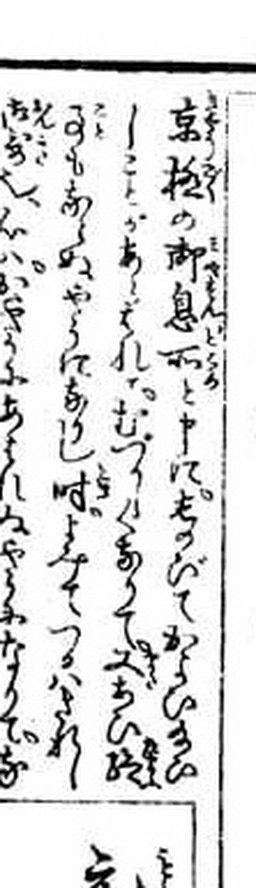しことがあらはればむづかしくなりて又あひ給元
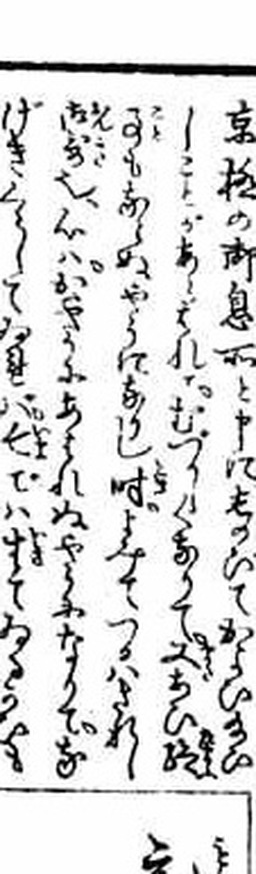事もあらぬやうになりし時よみてつかはされし良
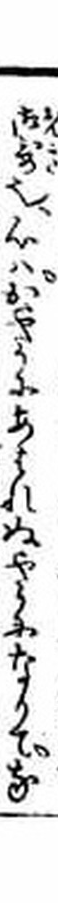御哥也心はかやうにあはれぬやうになりてな
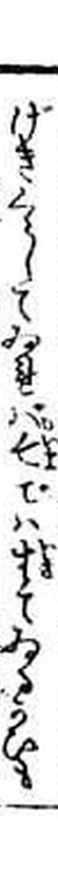げきくらしてゐれば今では生てゐるかひも
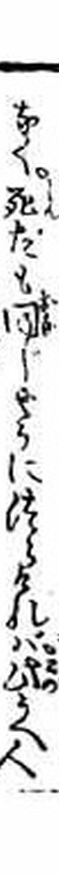なく死だも同じやうにつらければ此うへ人
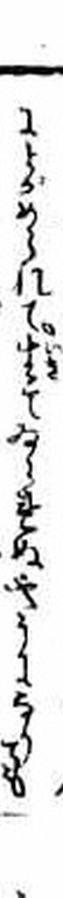にとがめられて生てゐられぬやうになりても
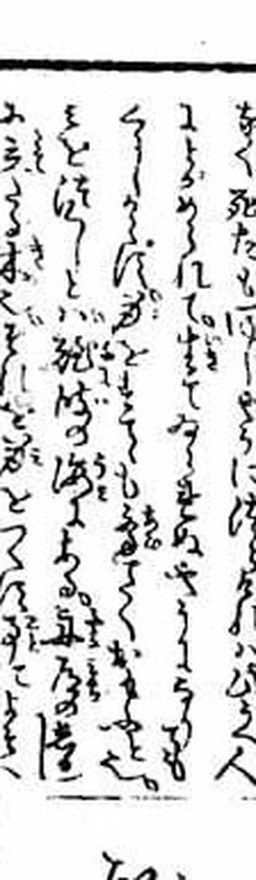くるしからず身をすてゝも逢たくおもふと也親
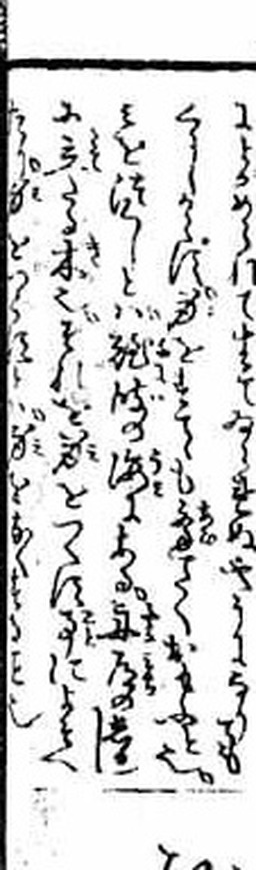みをつくしとは難波の海にある船道のしるし王
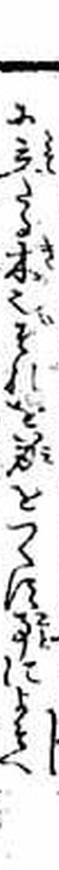に立たる木也それを身をつくすことによそへ
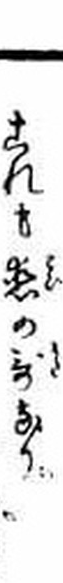これも恋の哥なり
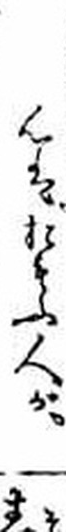心はおもふ人が素
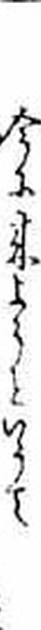今に来ようというて
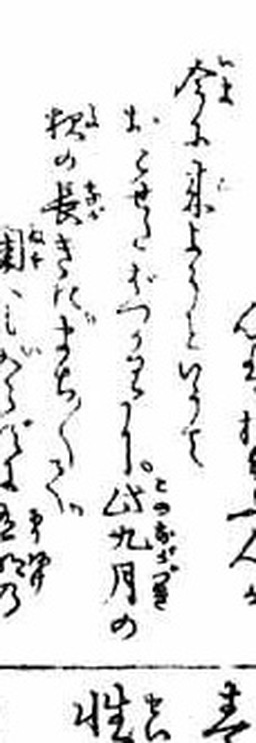おこせたばつかりに此の九月の性
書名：小倉百人一首
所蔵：東京学芸大学教育コンテンツアーカイブ
